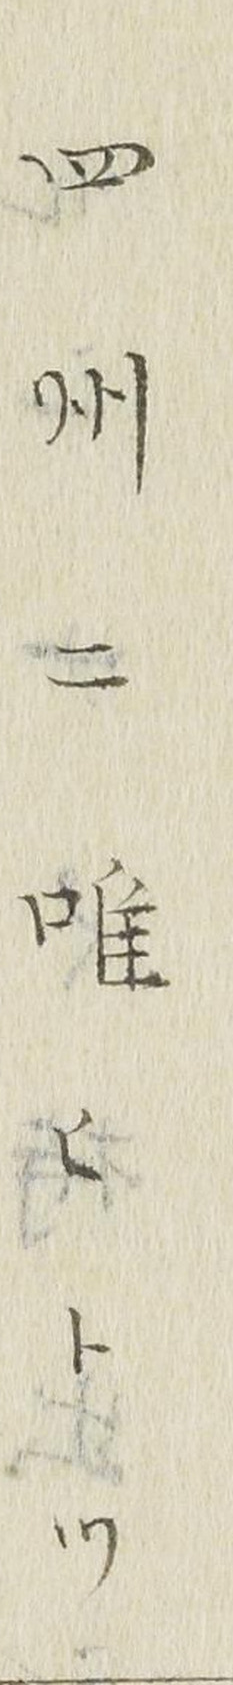四州ニ唯ヒトツ
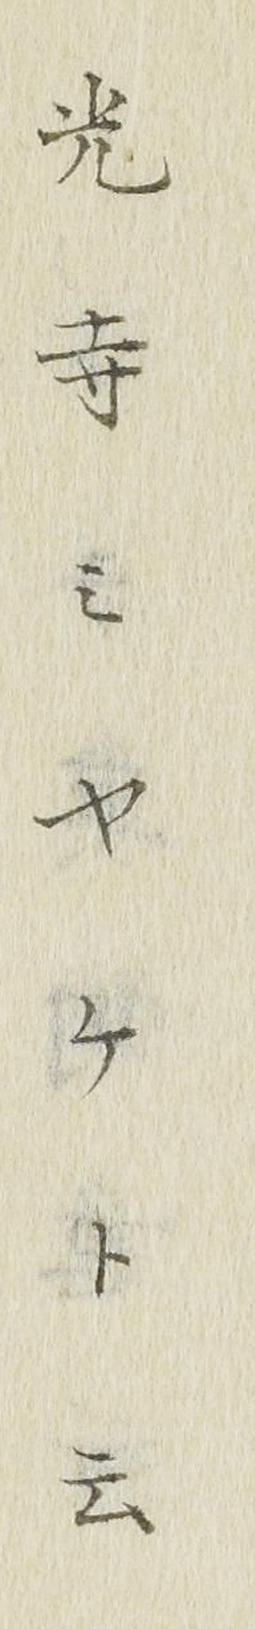光寺ミヤケト云
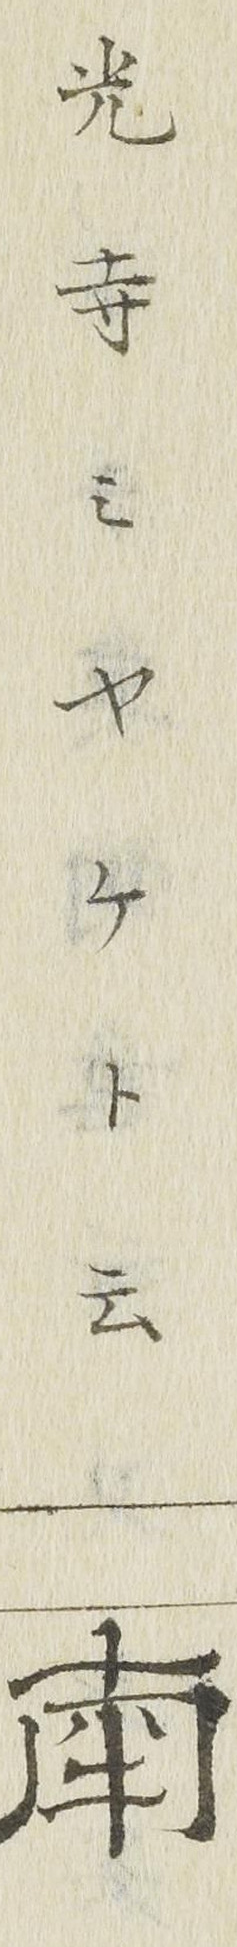光寺ミヤケト云
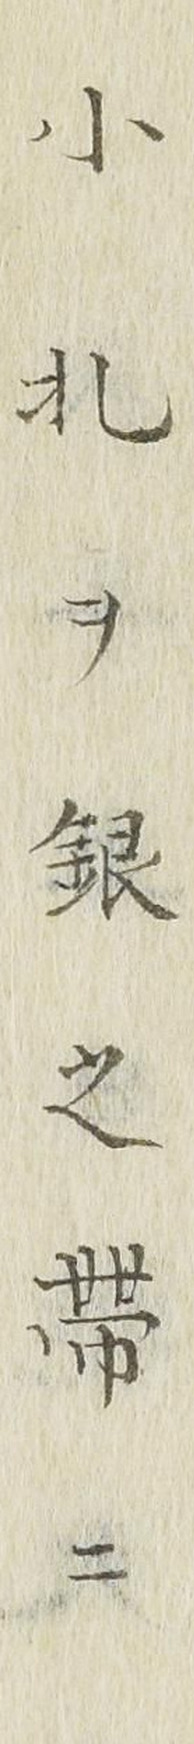小札ヲ銀之帯ニ
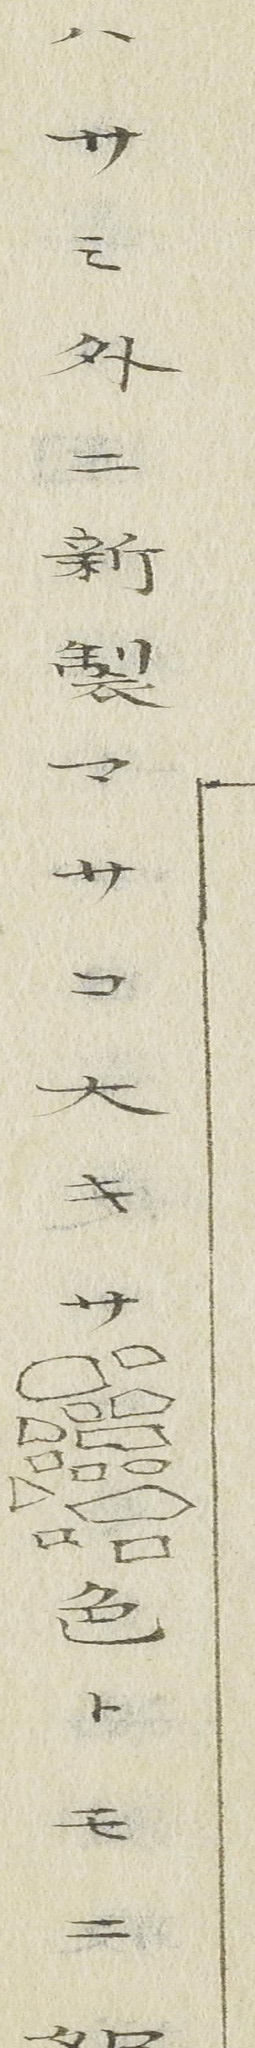ハサミ外ニ新製マサコ大キサ色トモニ如
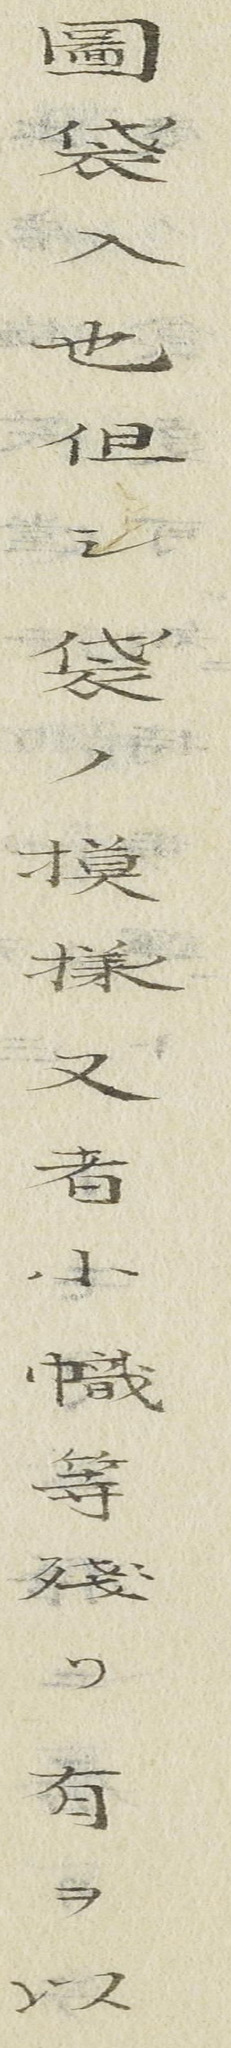図袋入也但シ袋ノ模様又者小幟等残リ有ヲ以
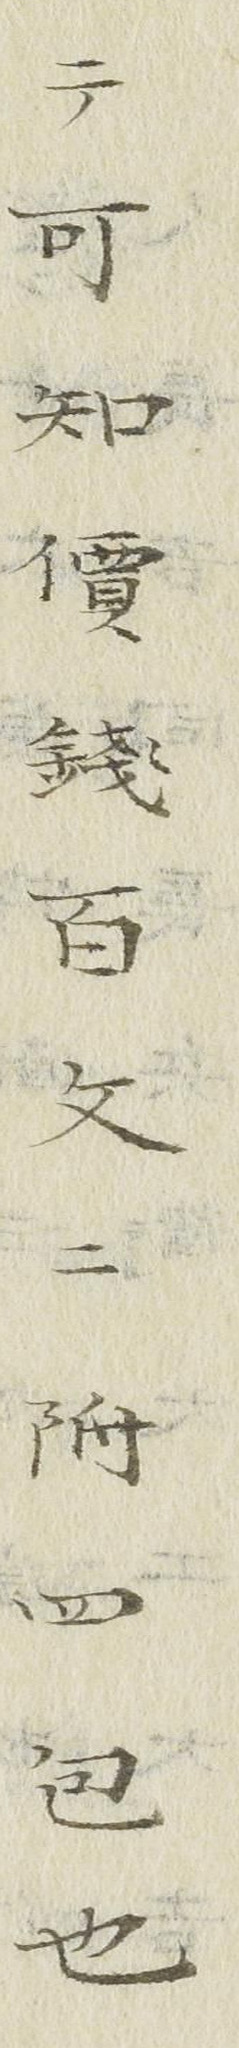テ可知價銭百文ニ附四包也
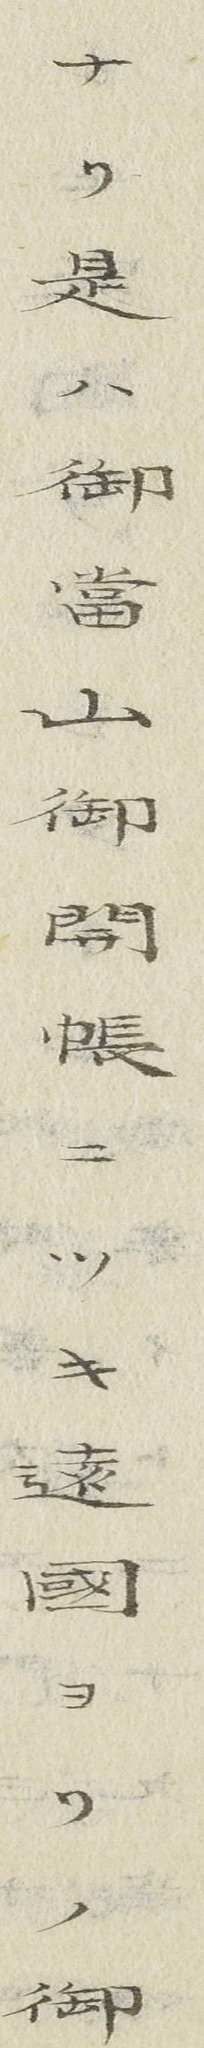ナリ是ハ御当山御開帳ニツキ遠国ヨリノ御
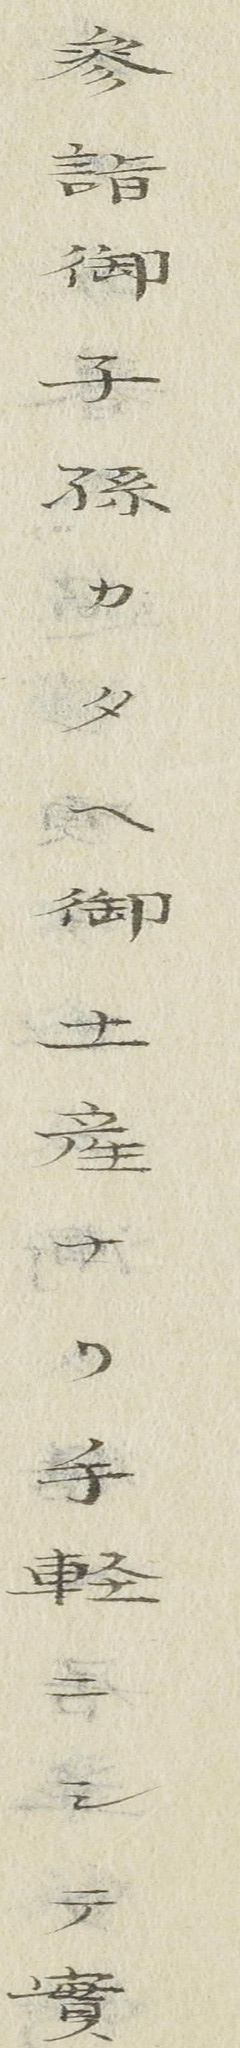参詣御子孫カタヘ御土産ナリ手軽ニシテ実
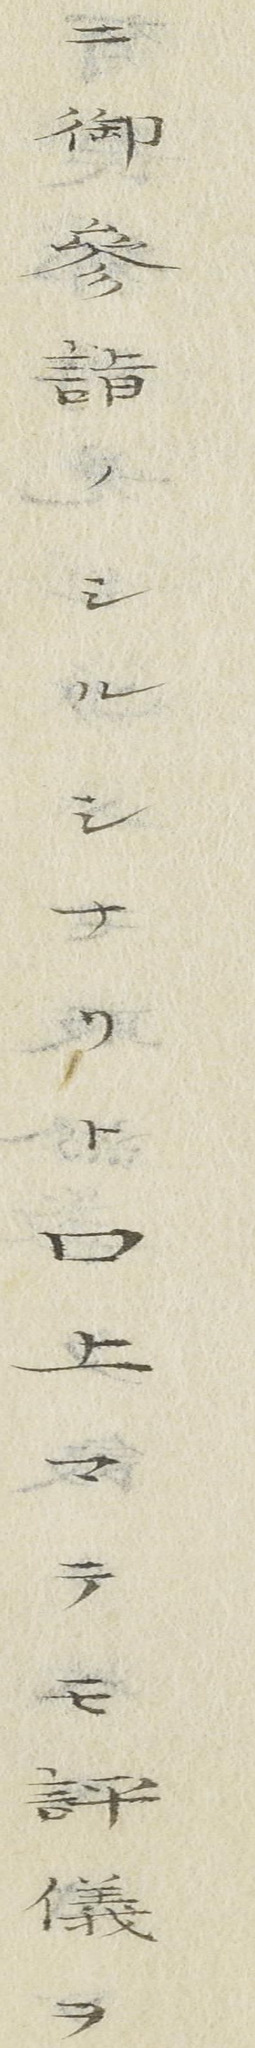ニ御参詣ノシルシナリト口上マテモ評儀ヲ
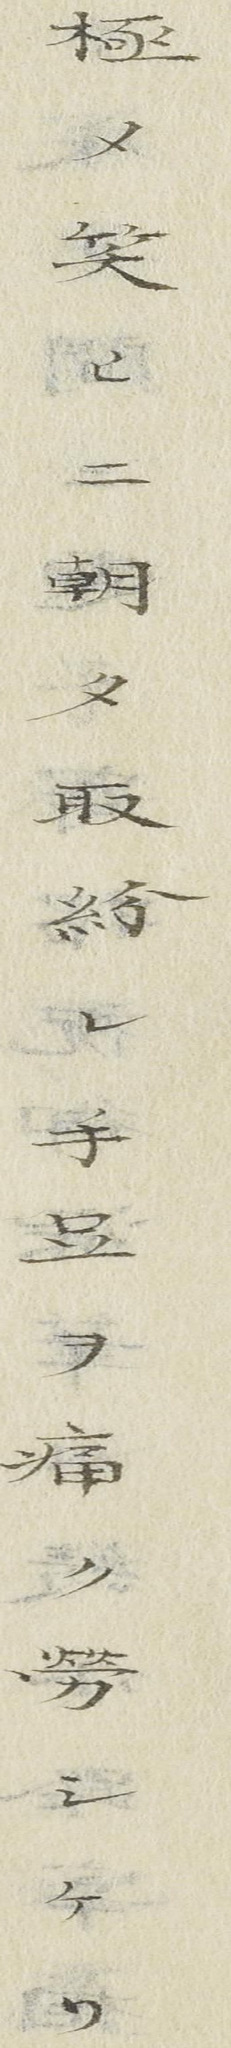極メ笑ヒニ朝夕取紛レ手豆ヲ痛ク労シケリ
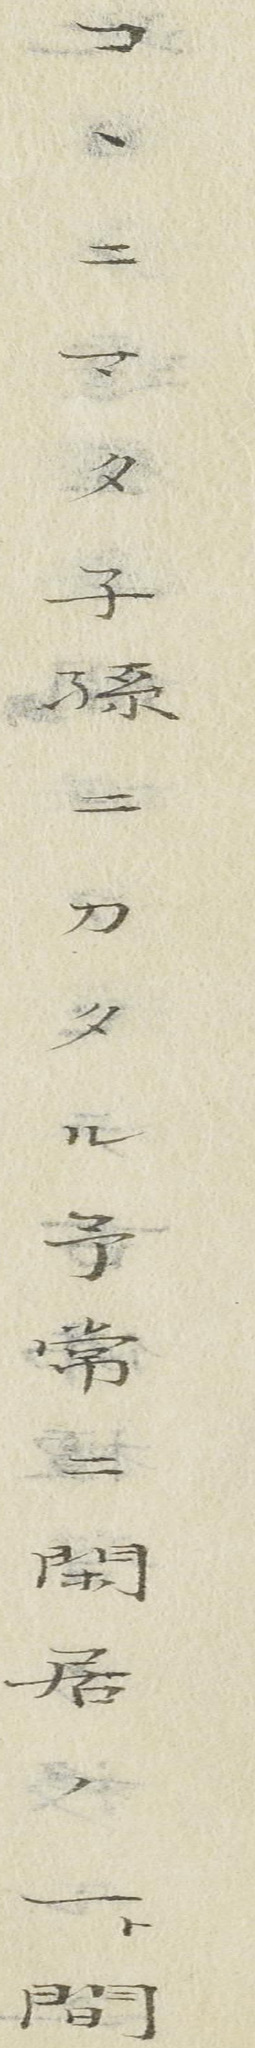コヽニマタ子孫ニカタル予常ニ閑居ノ一ト間
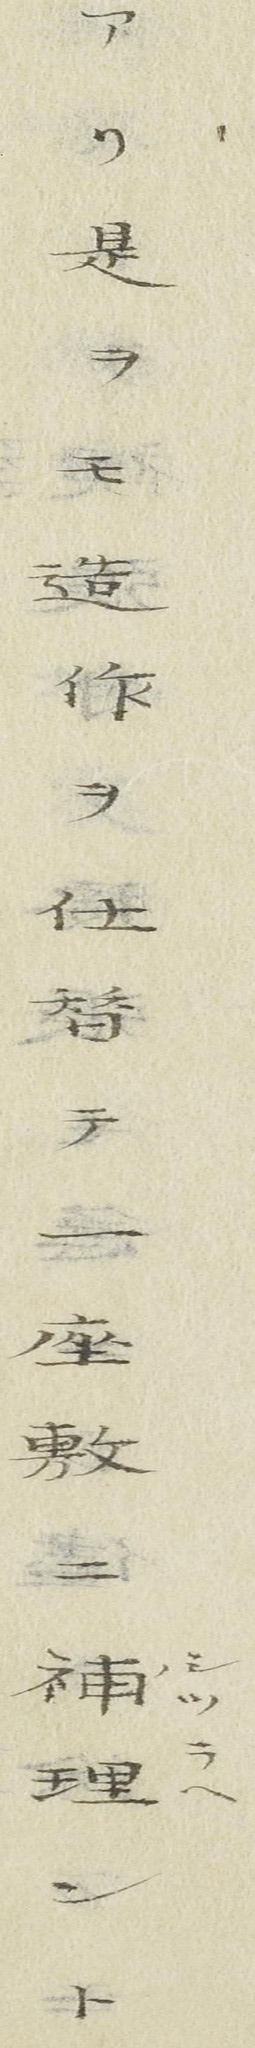アリ是ヲモ造作ヲ仕替テ一座敷ニ補理ント
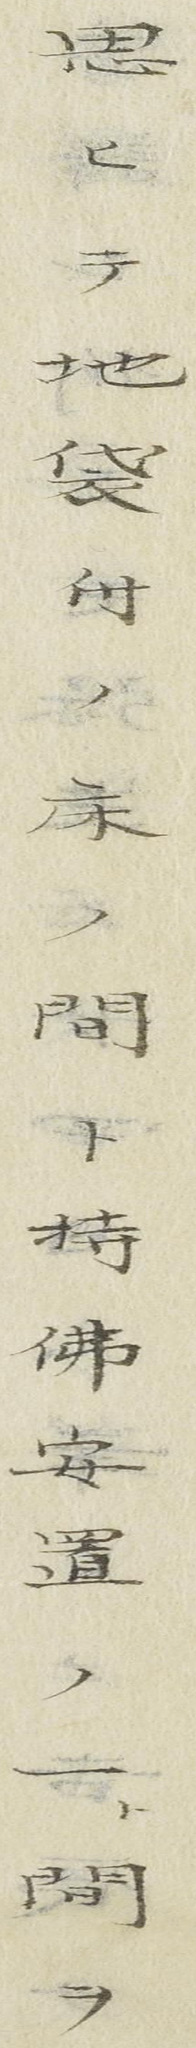思ヒテ地袋付ノ床ノ間ト持仏安置ノ一ト間ヲ

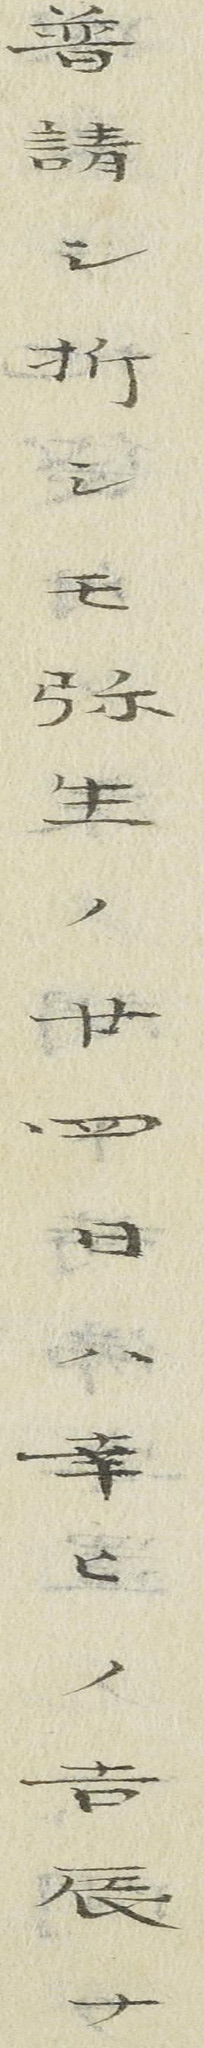普請シ折シモ弥生ノ廿四日ハ幸ヒノ吉辰ナ
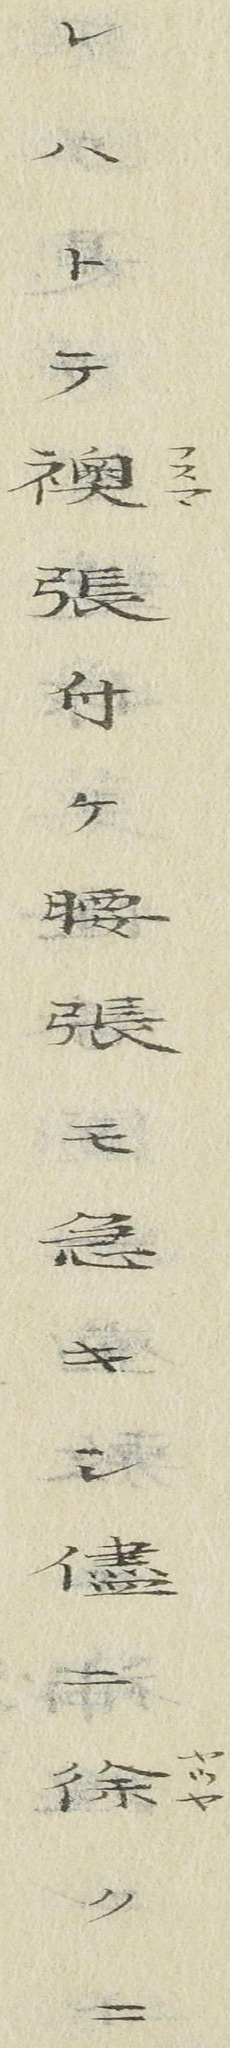レハトテ襖張付ケ腰張モ急キシ侭ニ徐クニ
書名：地災撮要　地震之部　巻ノ二
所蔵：東京大学地震研究所図書室 Earthquake Research Institute Library, The University of Tokyo, JAPAN
